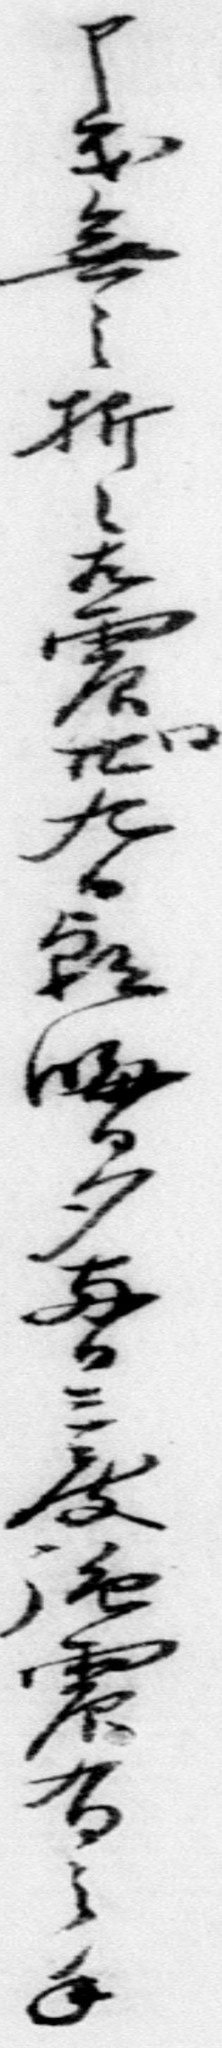申儀無之折々相震同廿九日朝晦日夕両日三度強震有之手
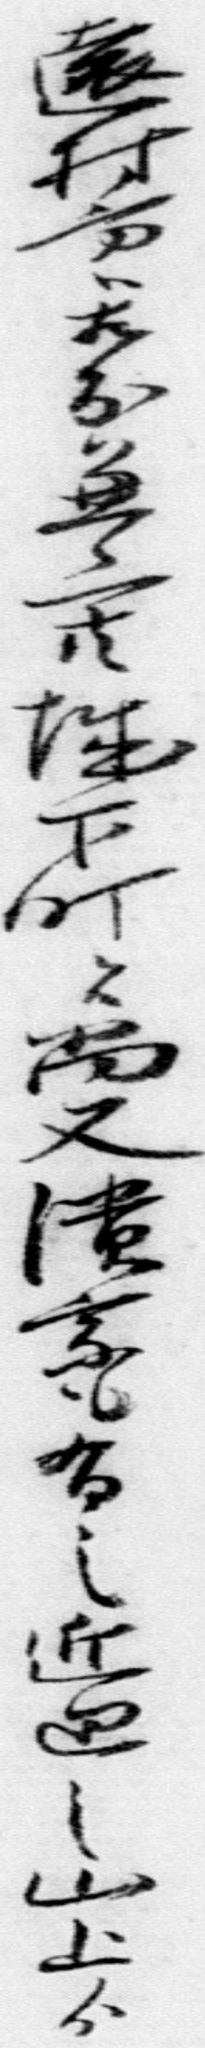遠村方は相分兼候へ共城下町には尚又潰家も有之近辺之山上ゟ
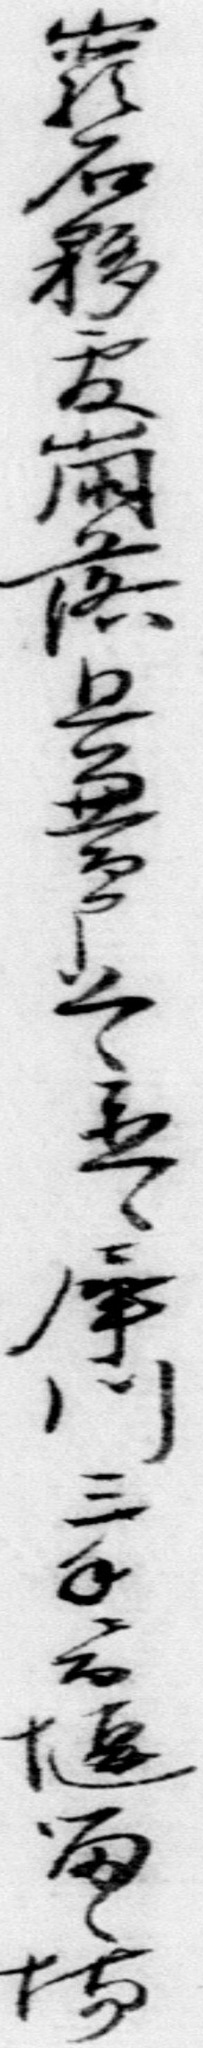巌石夥敷崩落且兼而申上置候犀川三手に而堰止候場

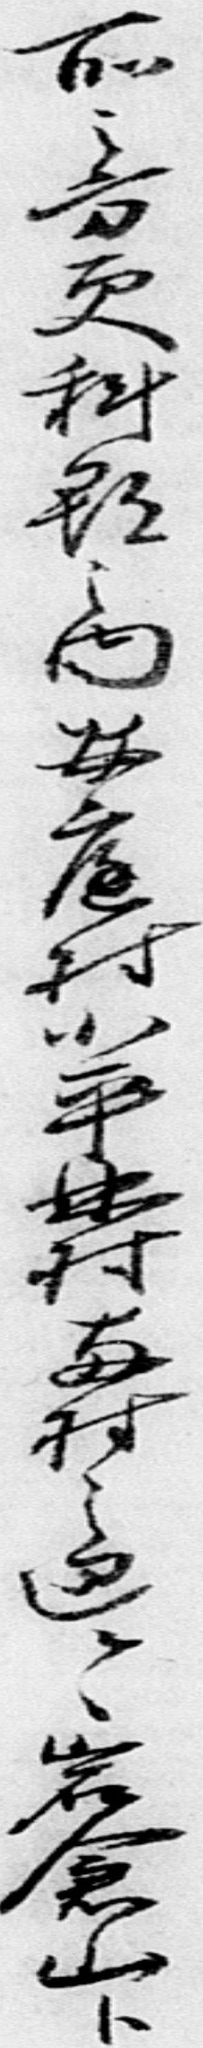所之方更科郡之内安庭村小平林村両村之辺に候岩倉山と
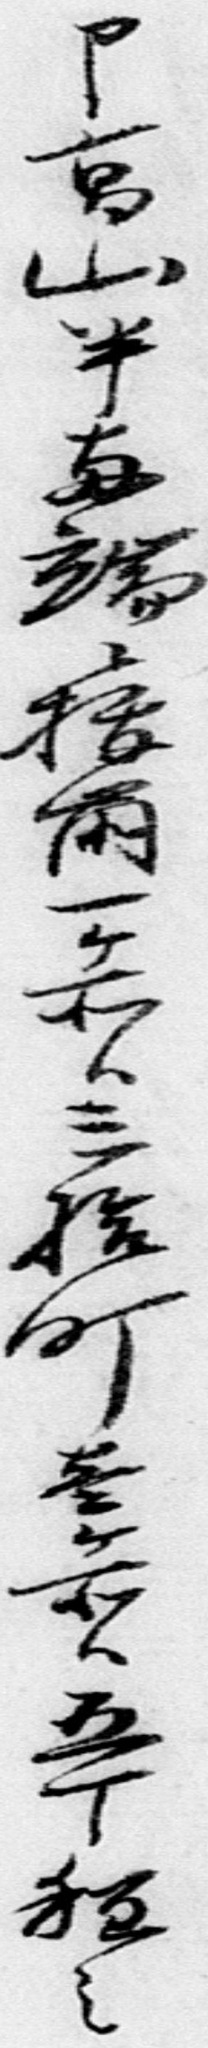申高山半両端に抜崩一ケ所は三拾町壱ケ所は五丁程之
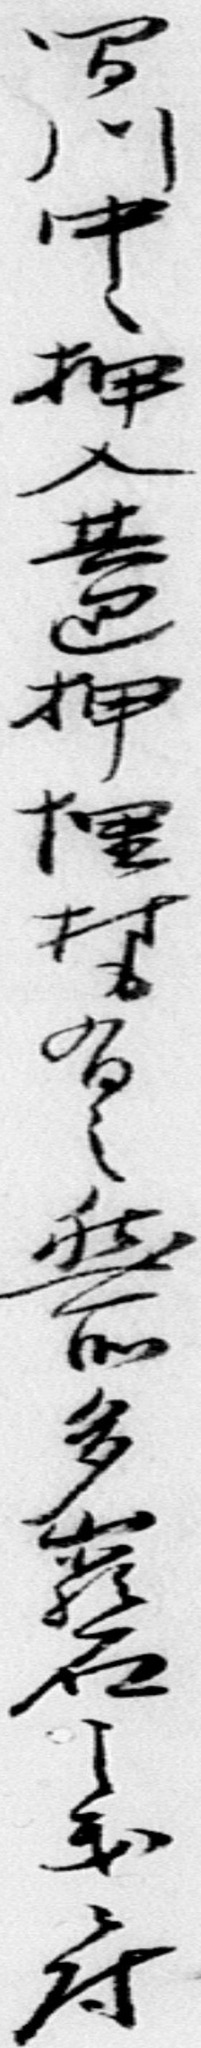間川中へ押入其辺押埋村も有之然所多巌石之義に付
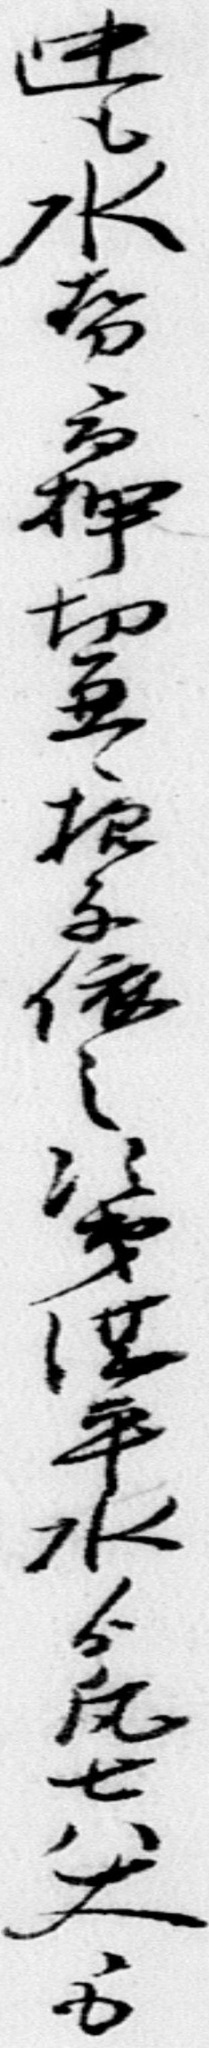迚も水勢に而押切兼候様子依之次第湛平水ゟ凡七八丈にも
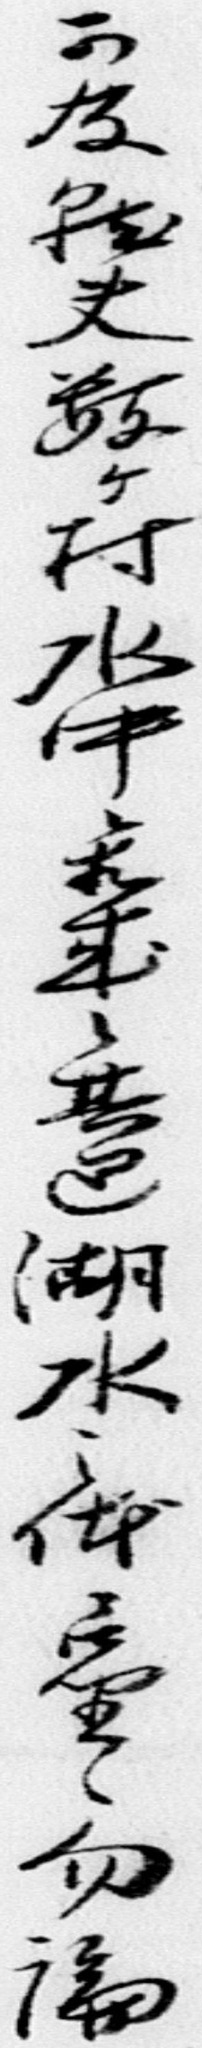可及就夫数ケ村水中に相成候其辺湖水之体に御座候勿論
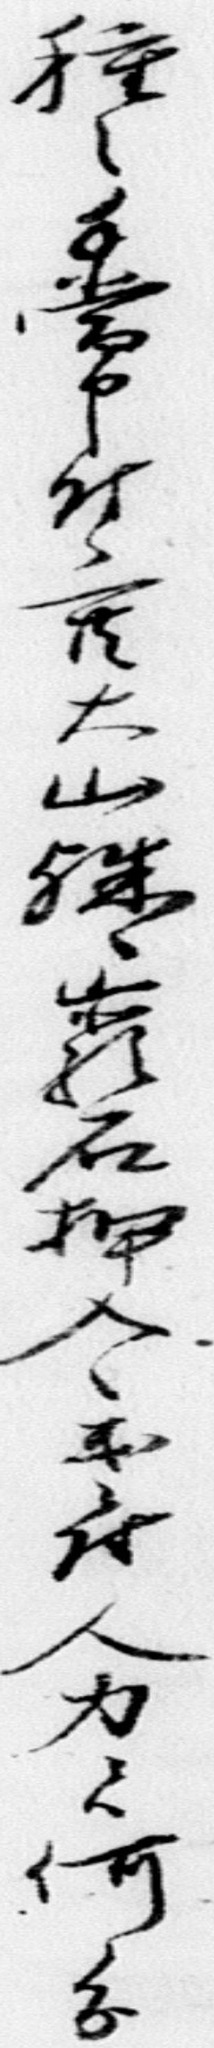種々手当申付候へ共大山殊に巌石押入候義に付人力には何分
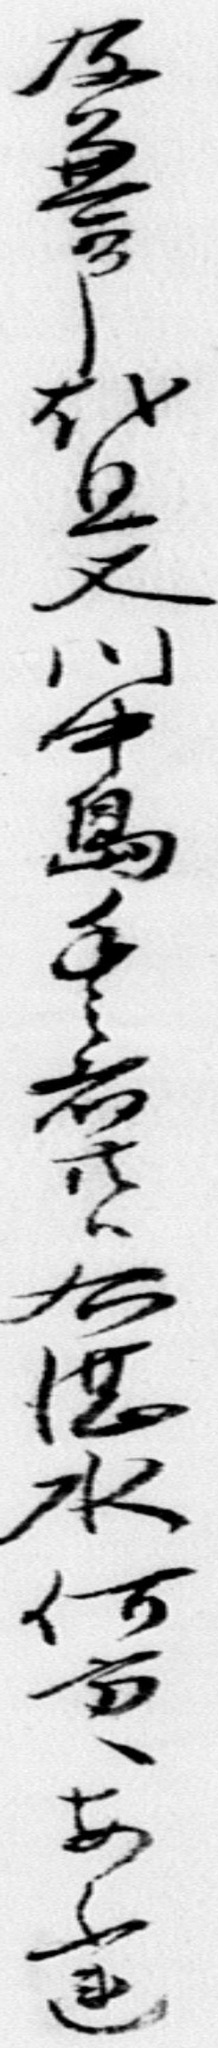及兼可申哉且又川中島手之者共は右湛水何方へあふれ
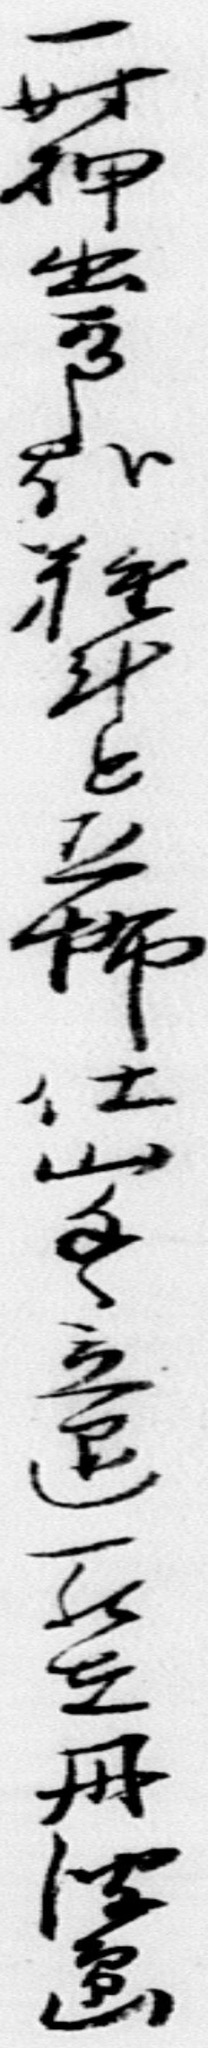一時押出可申哉難計と恐怖仕山手へ立退罷在丹波島
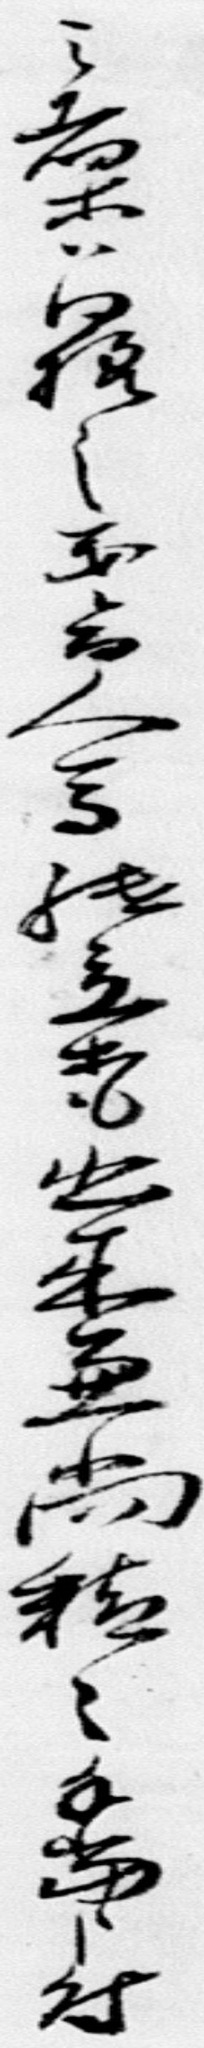之者等は同様之義に而人馬継立等も出来兼尚精々手当申付
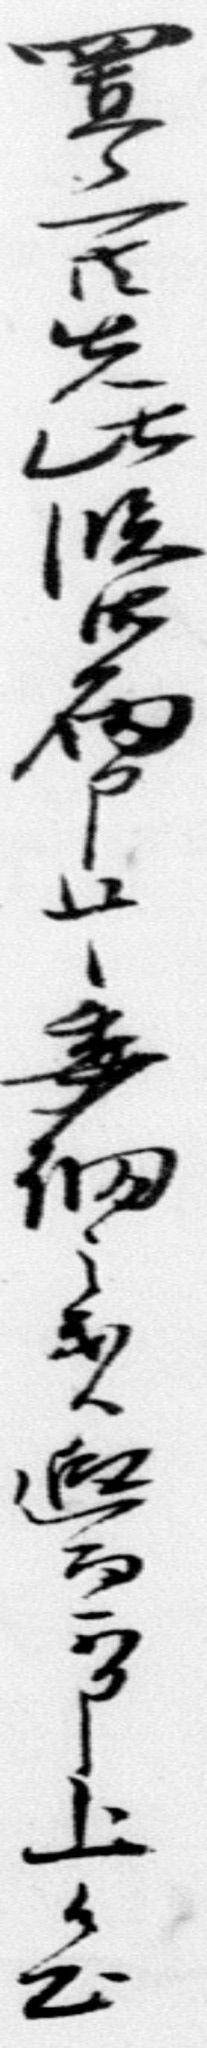置候へ共先此段御届申上候委細之義は追而可申上候以上
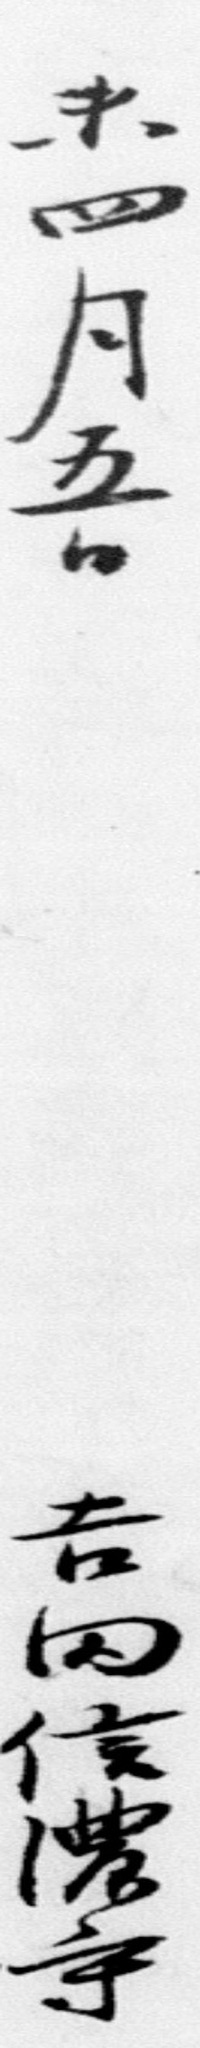未四月五日吉田信濃守
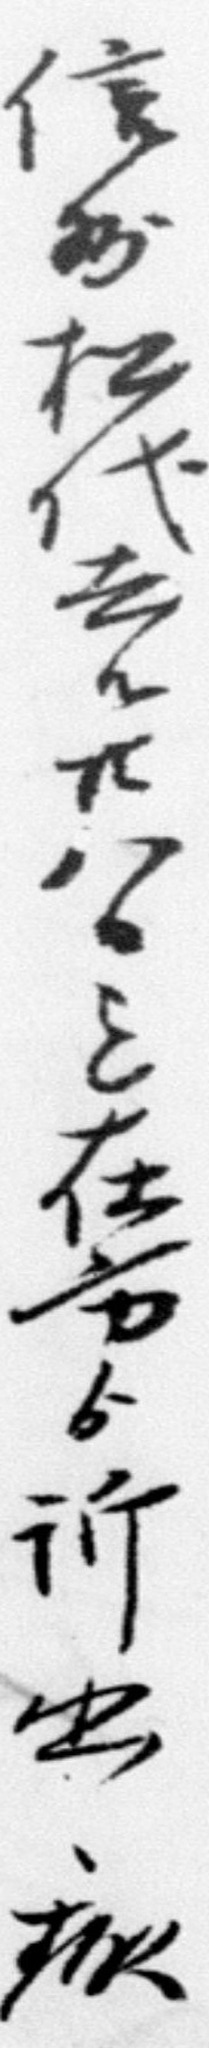信州松代去る廿八日迄在方ゟ訴出候趣
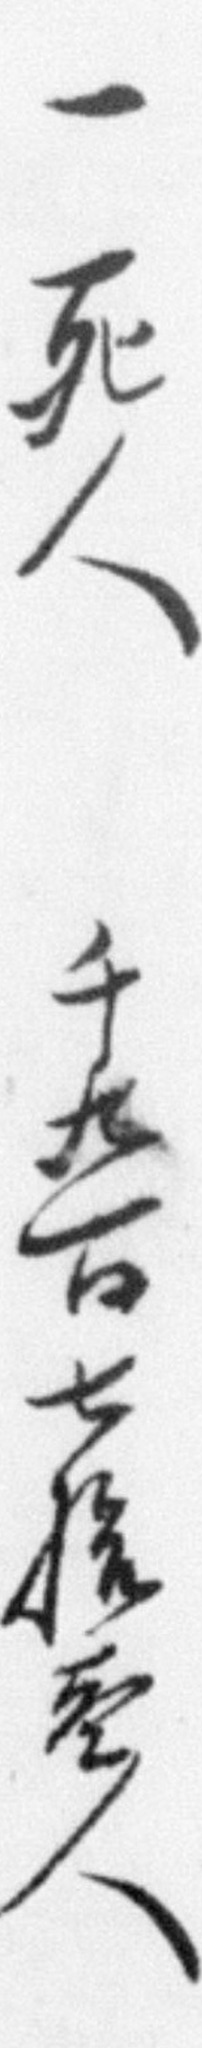一死人千九百七拾壱人
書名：信州大地震一件
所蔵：徳島県立図書館
